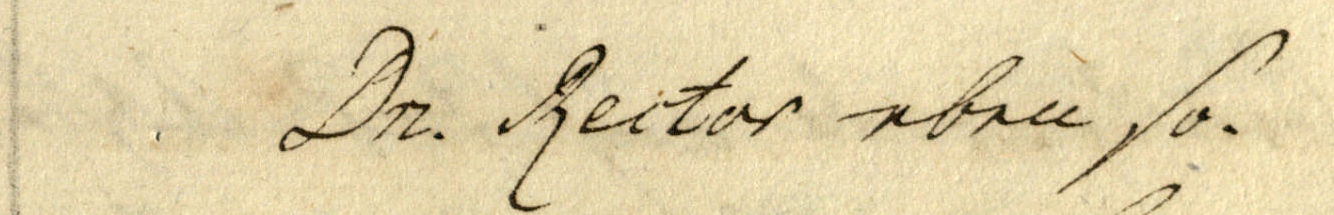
Dn. Rector eben so.
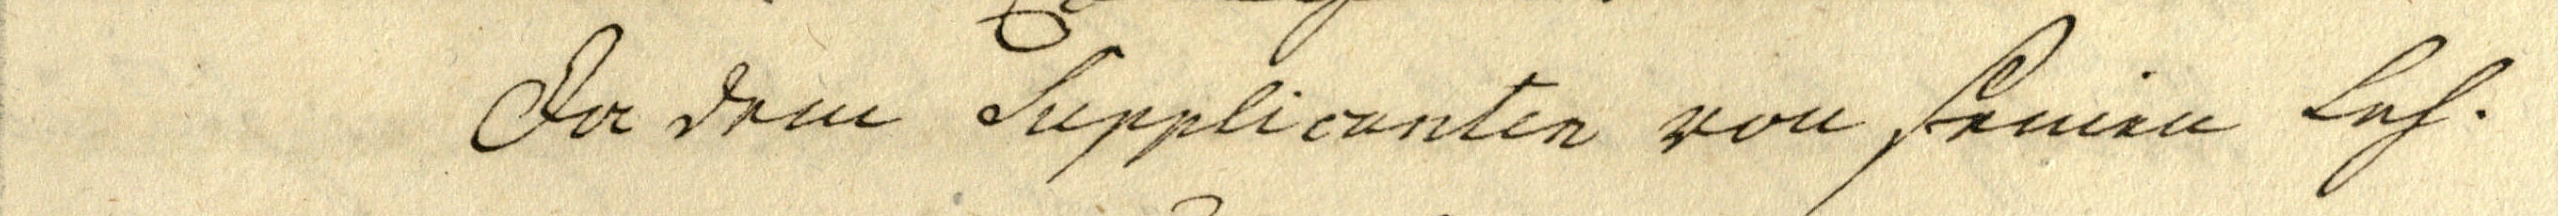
Da dem Supplicanten von seinen Leh-
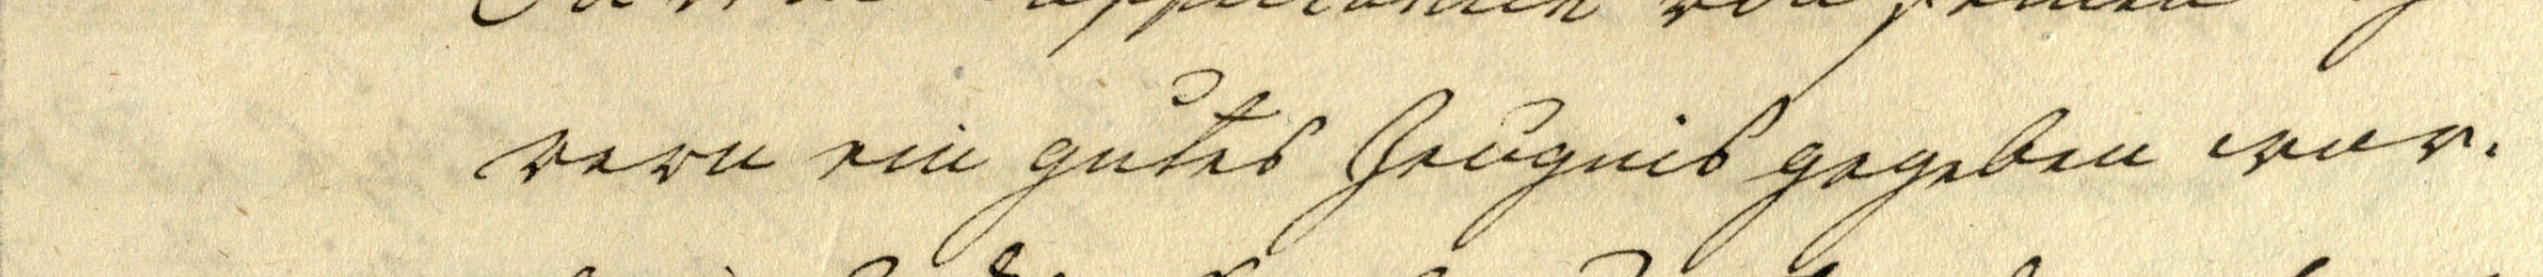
rern ein gutes Zeugnis gegeben wor-
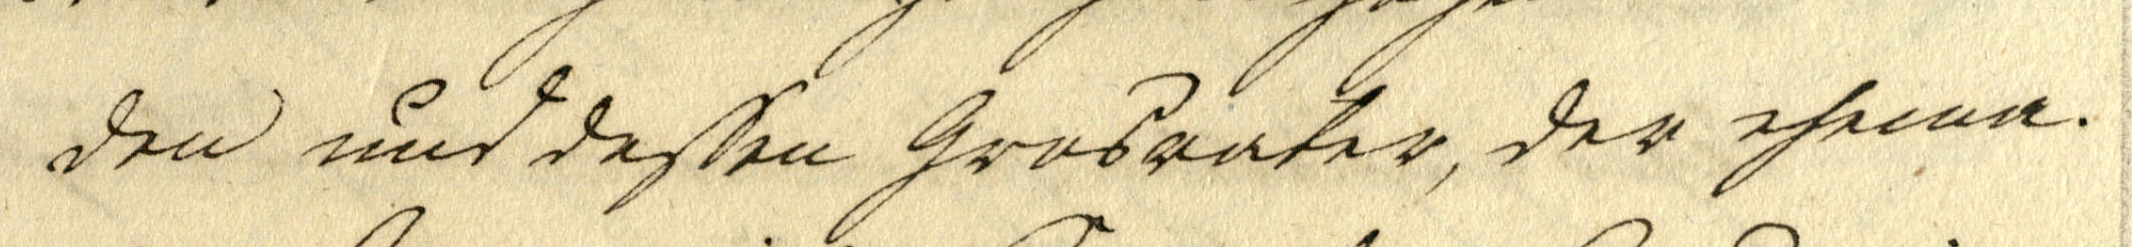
den und dessen Grosvater, der ehema-
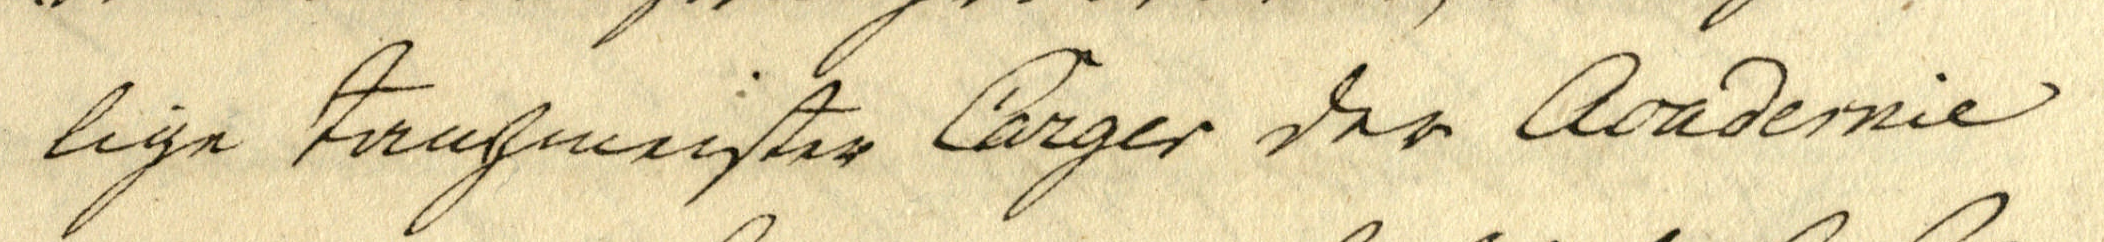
lige Tanzmeister Carger der Academie
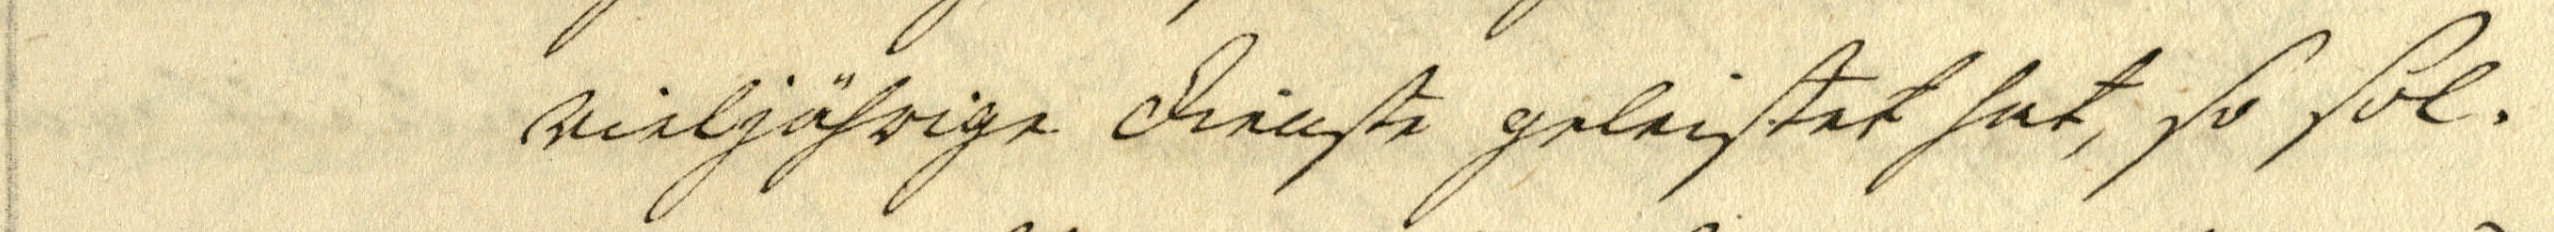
vieljährige Dienste geleistet hat, so sol-
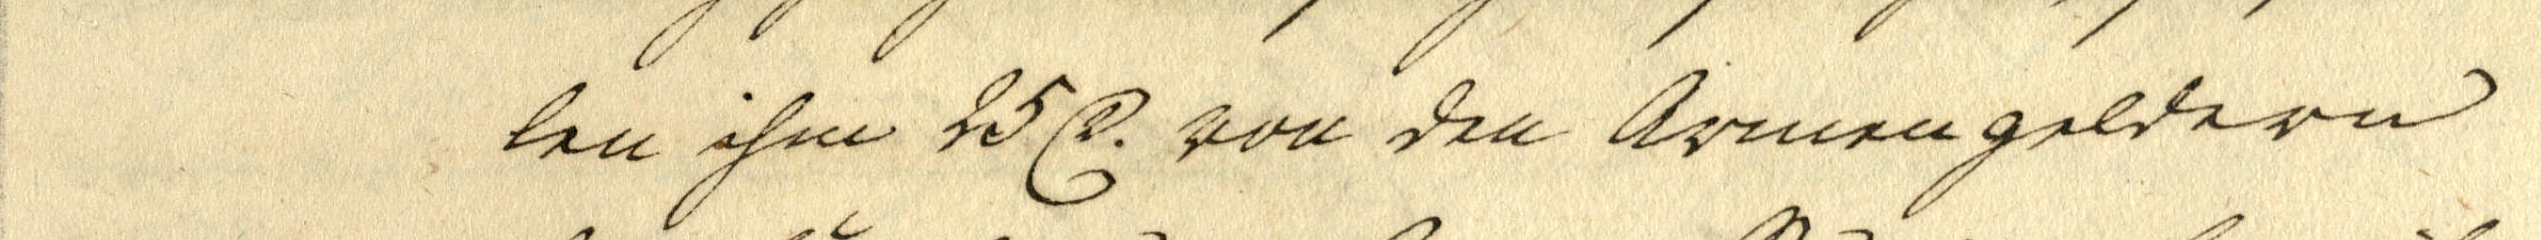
len ihm 25 rtl. von den Armengeldern
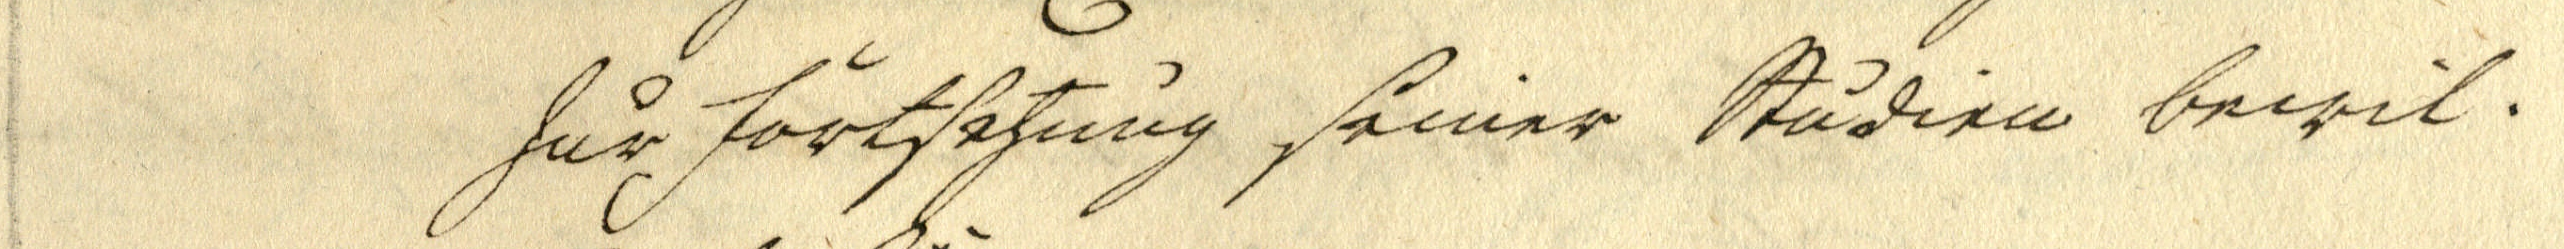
zur Fortsetzung seiner Studien bewil-
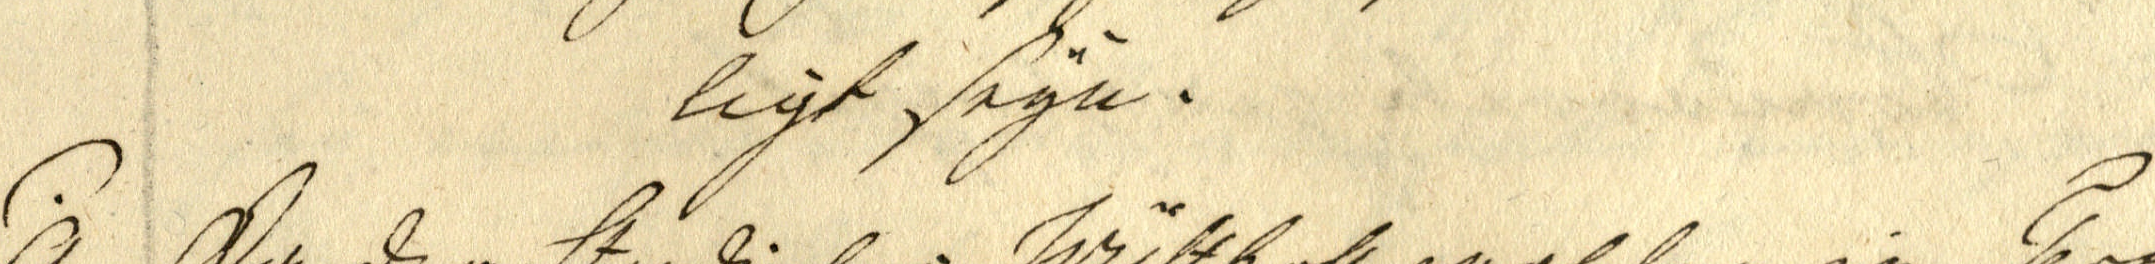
ligt seyn.
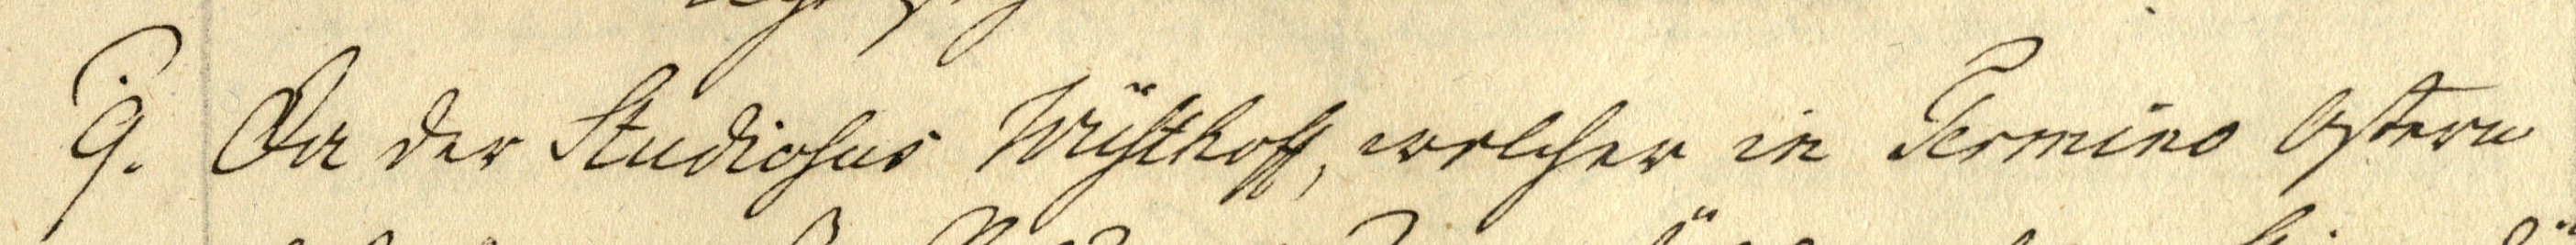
9. Da der Studiosus Wüsthoff, welcher in Termino Ostern
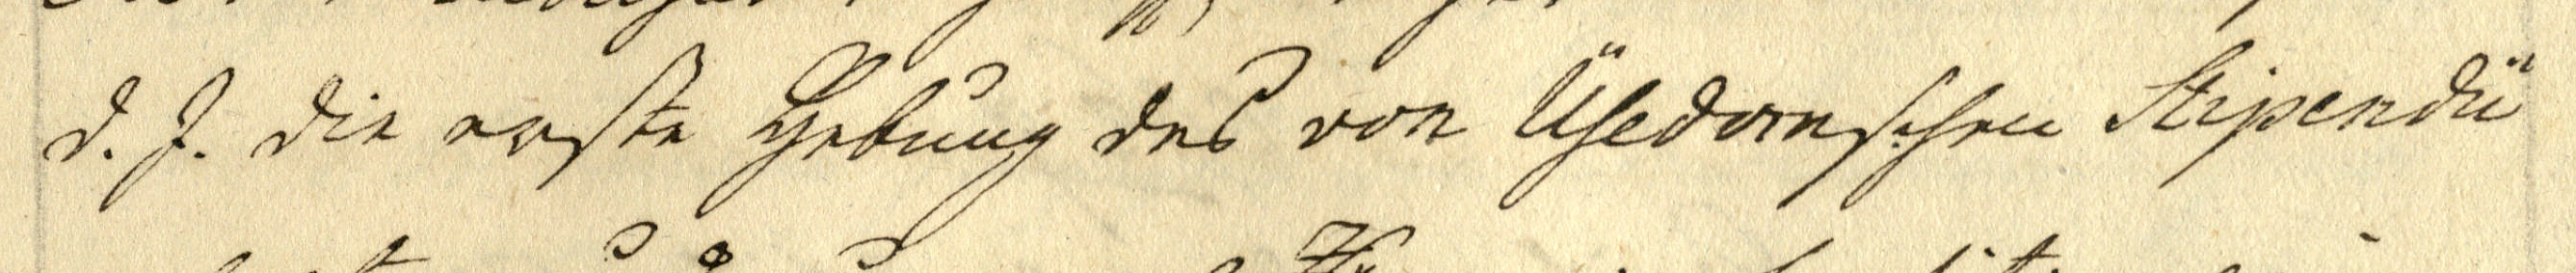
d. J. die erste Hebung des von Usedomschen Stipendii
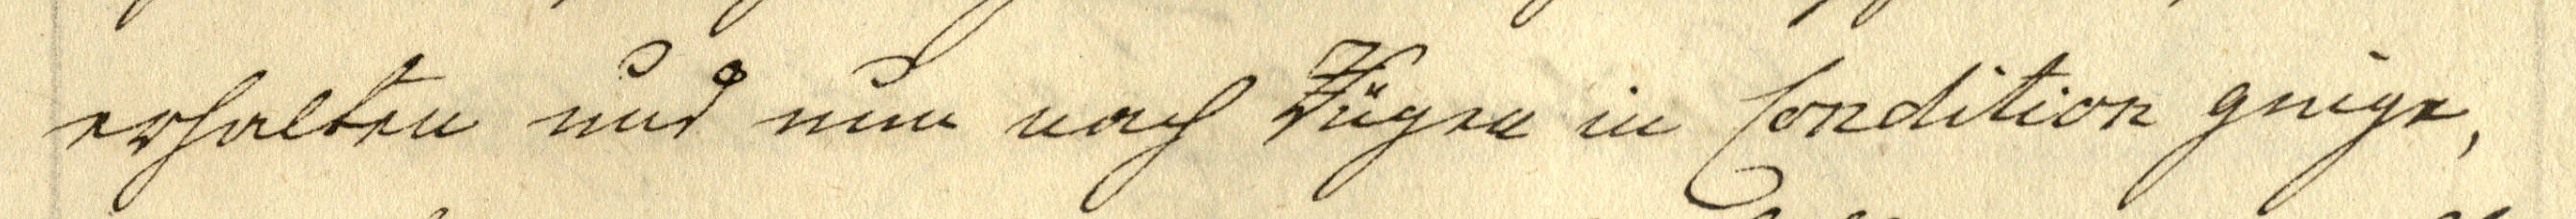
erhalten und nun nach Rügen in Condition ginge,
